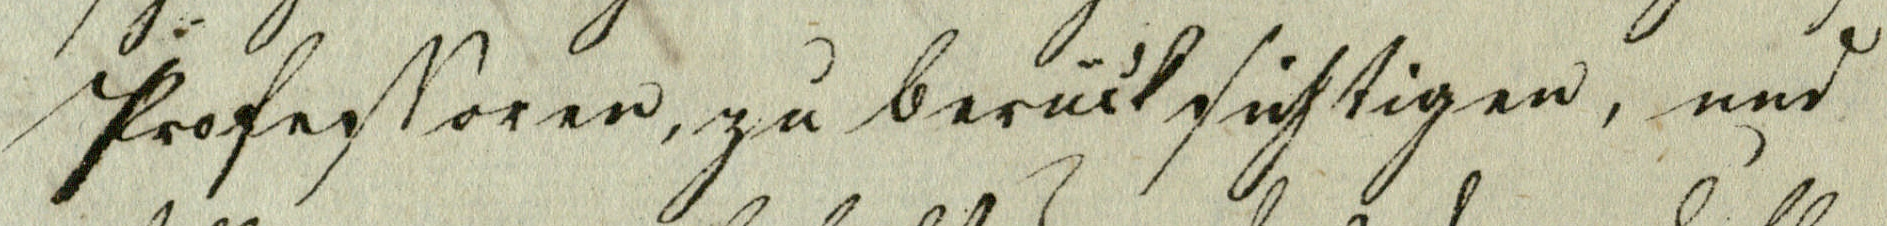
Professoren, zu berücksichtigen, und
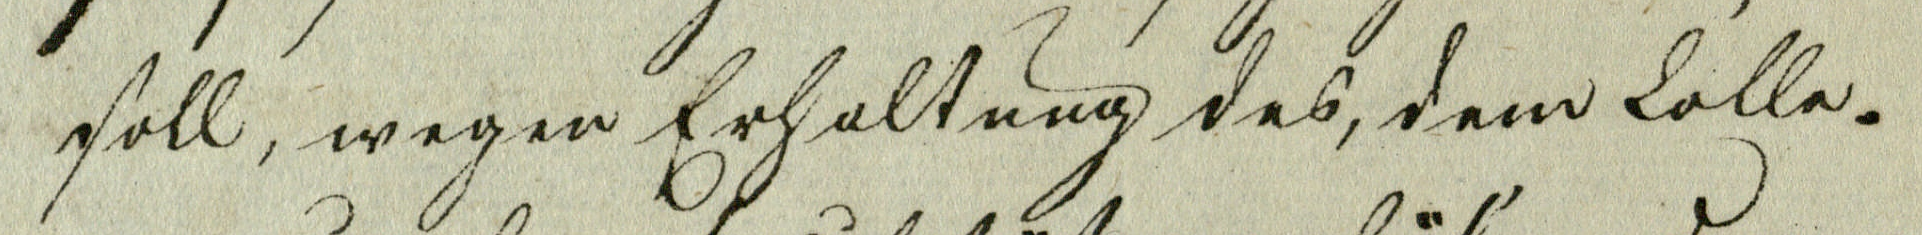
soll, wegen Erhaltung des, dem Colle¬
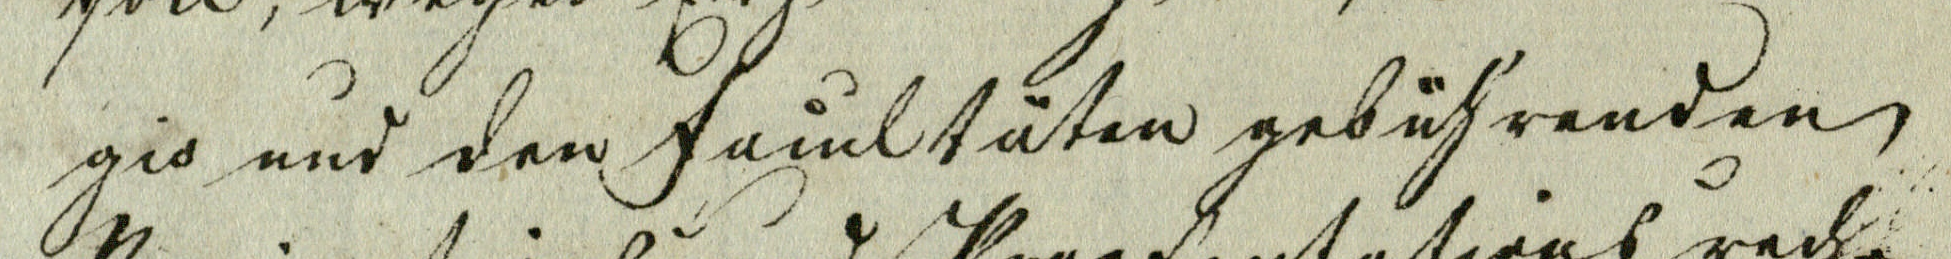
gio und den Facultäten gebührenden
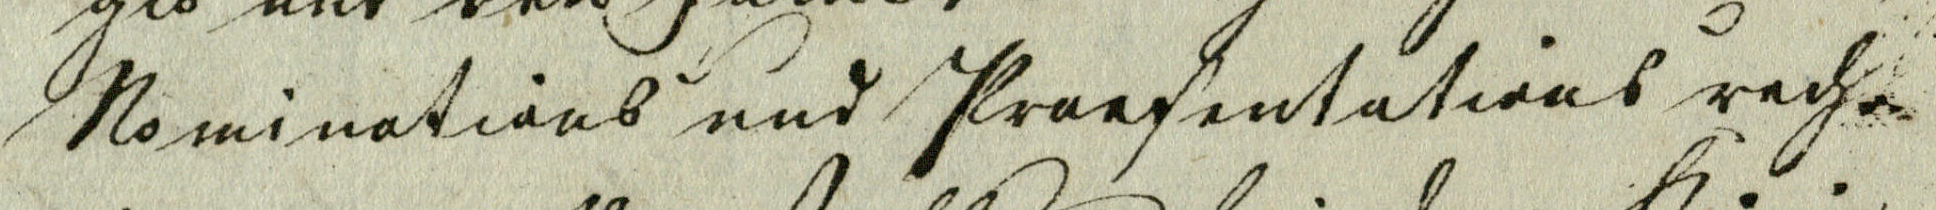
Nominations- und Praesentationsrech¬
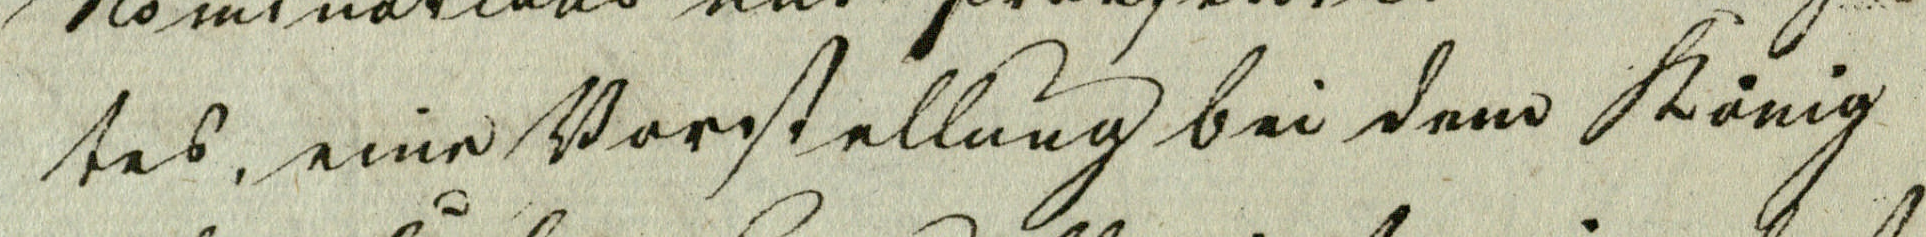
tes, eine Vorstellung bei dem König¬
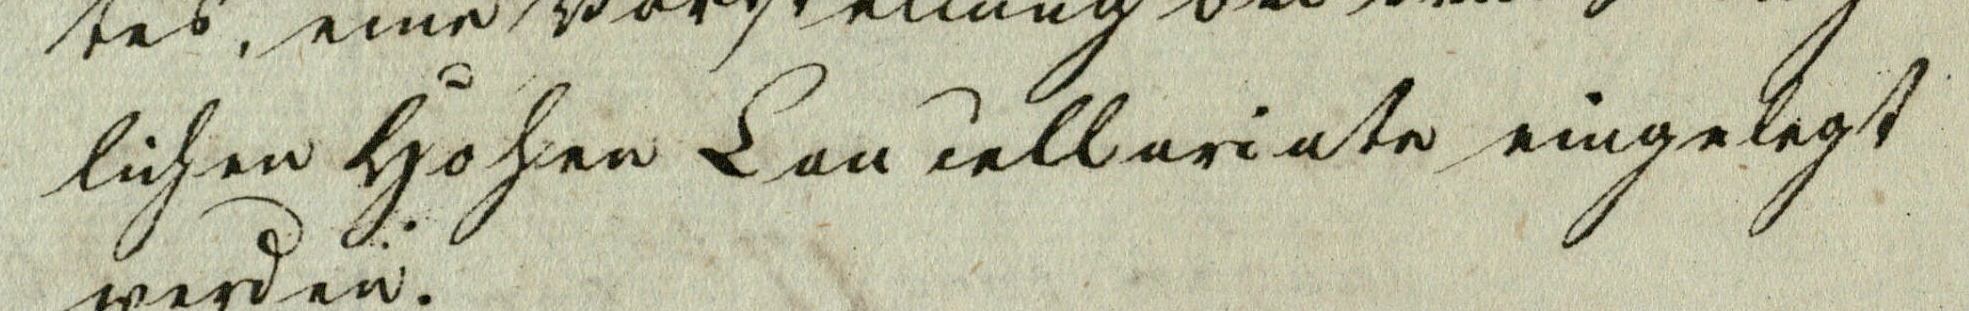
lichen Hohen Cancellariate eingelegt
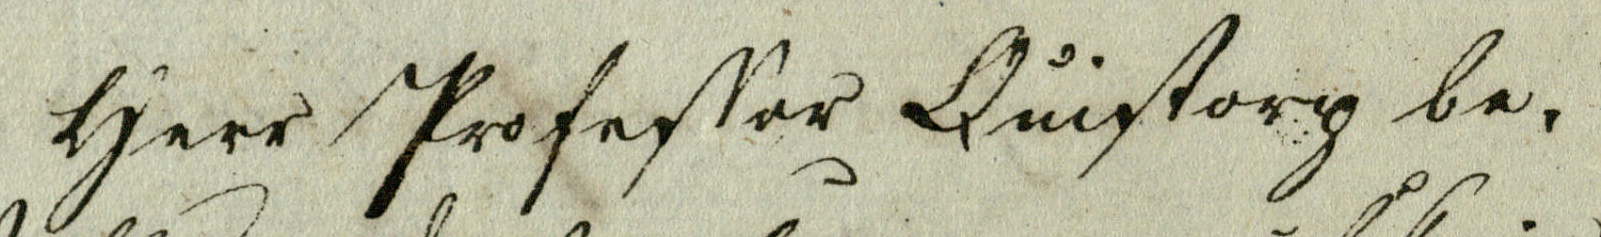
Herr Professor Quistorp be¬
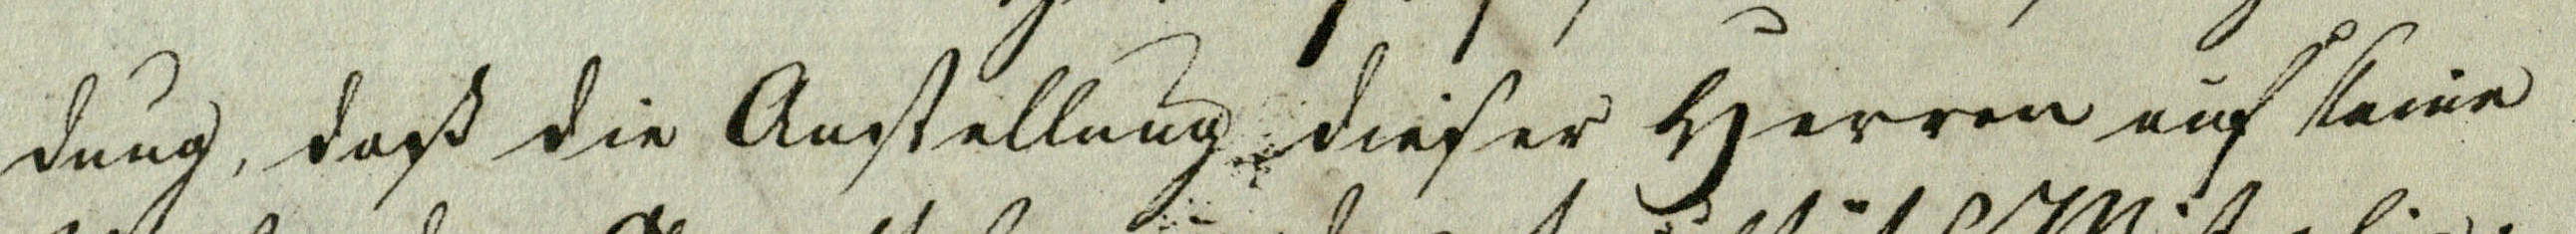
dung, daß die Anstellung dieser Herren auf keine
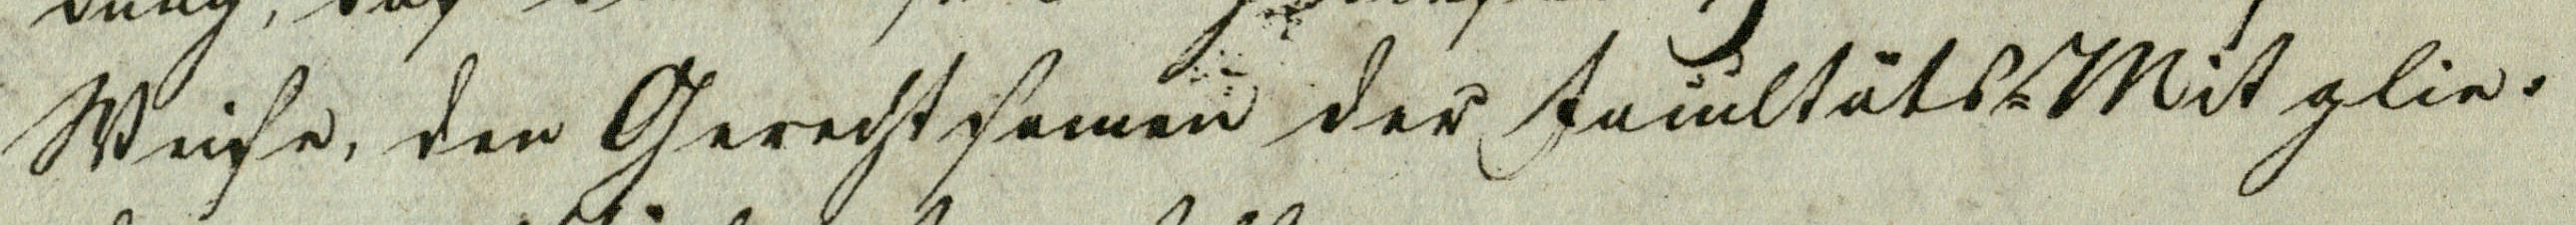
Weise, den Gerechtsamen der Facultäts-Mitglie¬
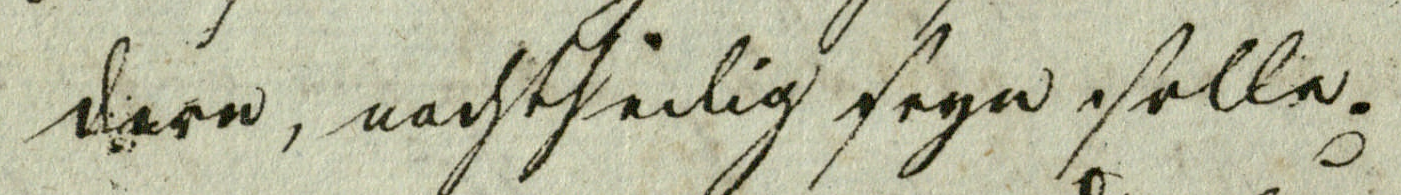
dern , nachtheilig seyn solle.
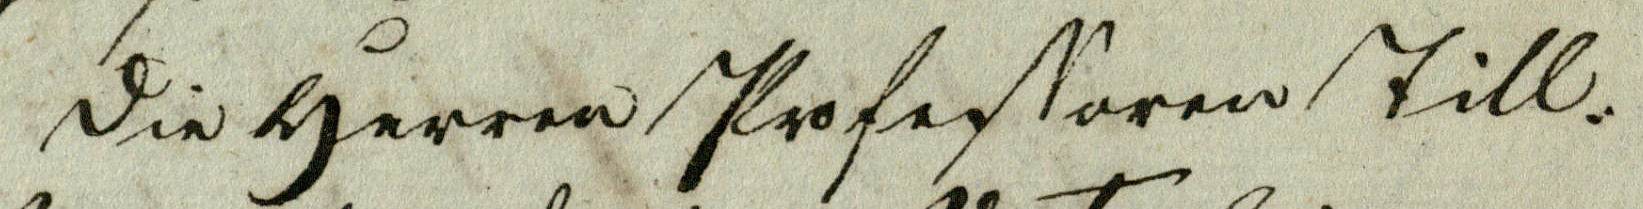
Die Herren Professoren Till¬
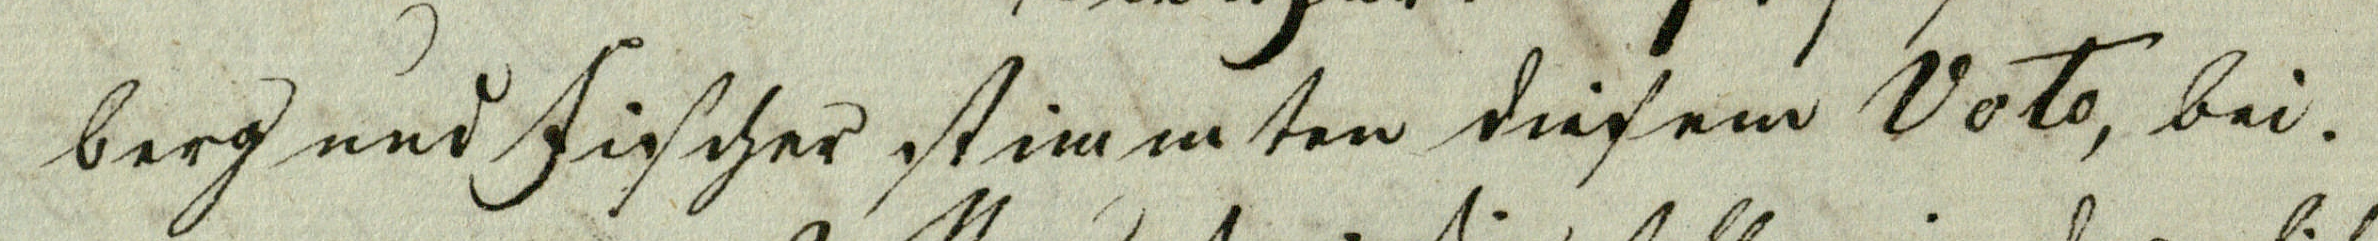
berg und Fischer stimmten diesem Voto, bei.
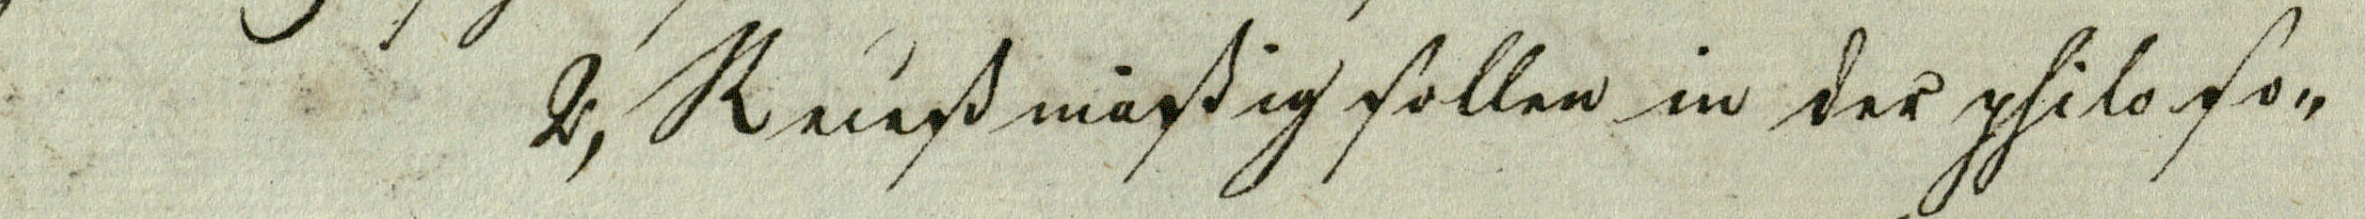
2, Receßmäßig sollen in der philoso¬
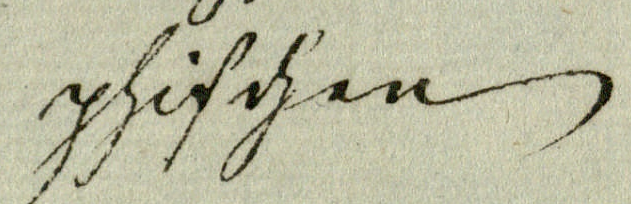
phischen
